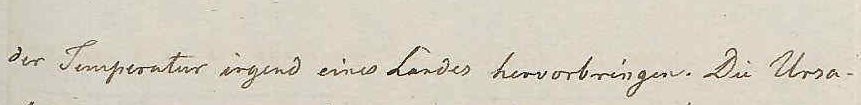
der Temperatur irgend eines Landes hervorbringen. Die Ursa-
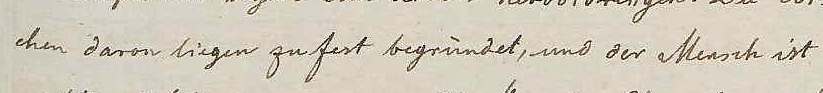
chen davon liegen zu fest begründet, und der Mensch ist
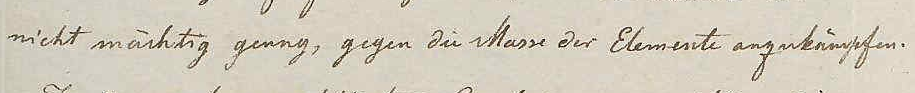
nicht mächtig genug, gegen die Masse der Elemente anzukämpfen.
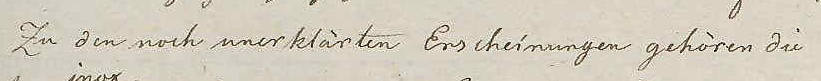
Zu den noch unerklärten Erscheinungen gehören die
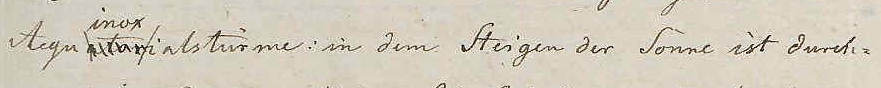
Aequatorinoxialstürme: in dem Steigen der Sonne ist durch-
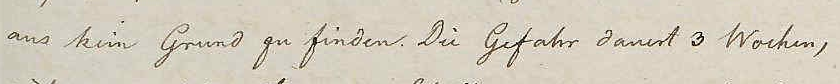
aus kein Grund zu finden. Die Gefahr dauert 3 Wochen,
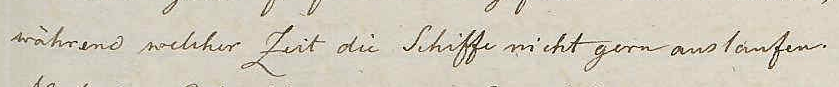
während welcher Zeit die Schiffe nicht gern auslaufen.
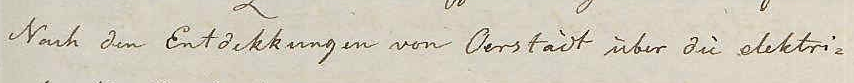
Nach den Entdekkungen von Oerstädt über die elektri-
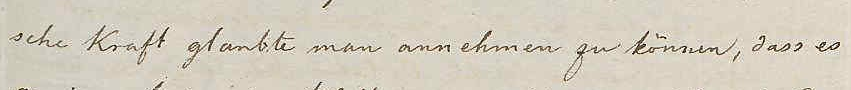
sche Kraft glaubte man annehmen zu können, dass es
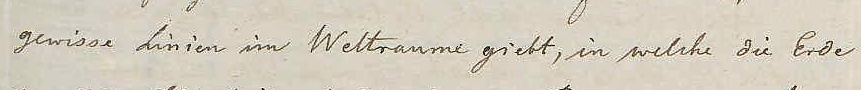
gewisse Linien im Weltraume giebt, in welche die Erde
